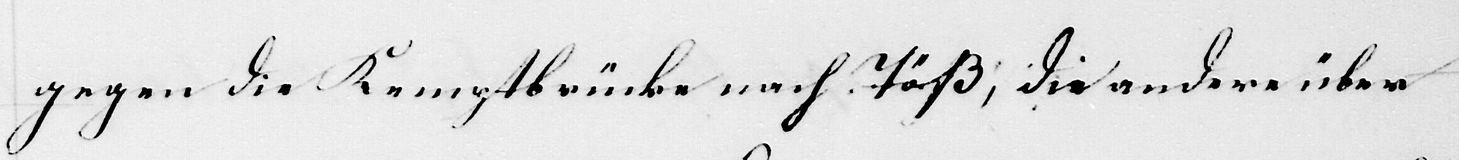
gegen die Kemptbrücke nach Töß, die andere über
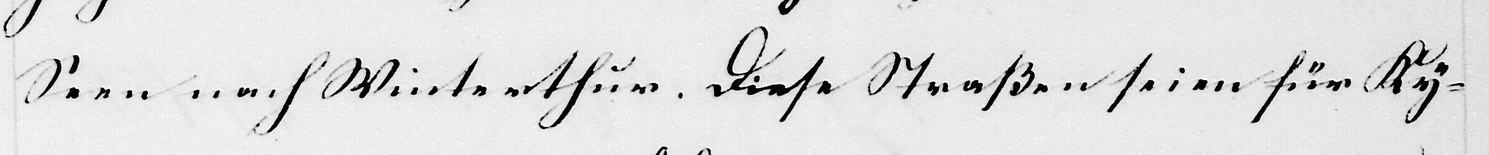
Seen nach Winterthur. Diese Straßen seien für Ky¬
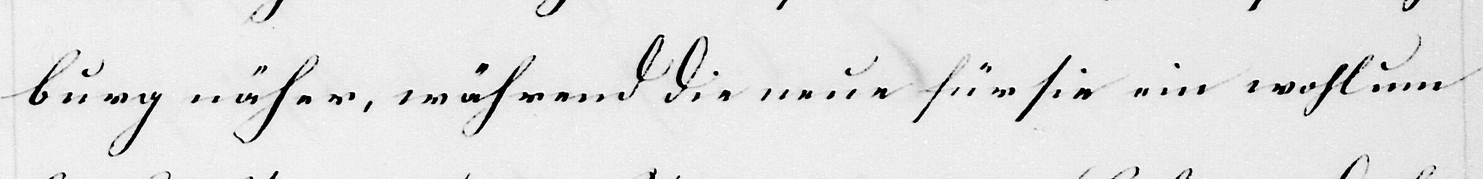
burg näher, während die neue für sie ein wohl um
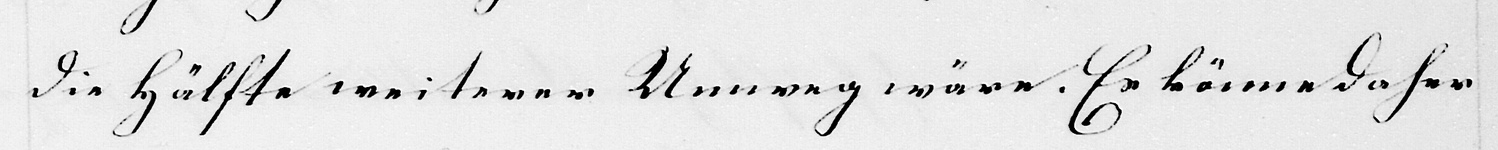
die Hälfte weiterer Umweg wäre. Es könne daher
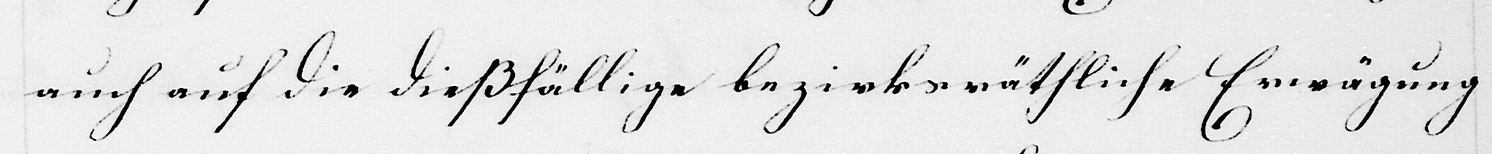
auch auf die dießfällige bezirksräthliche Erwägung
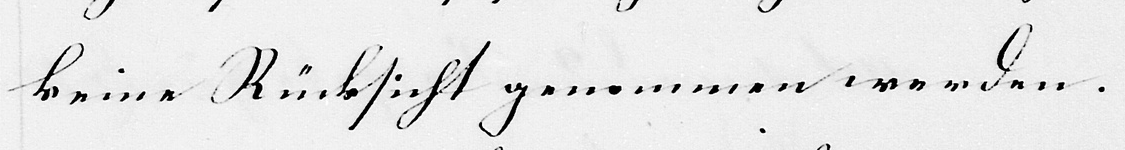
keine Rücksicht genommen werden.
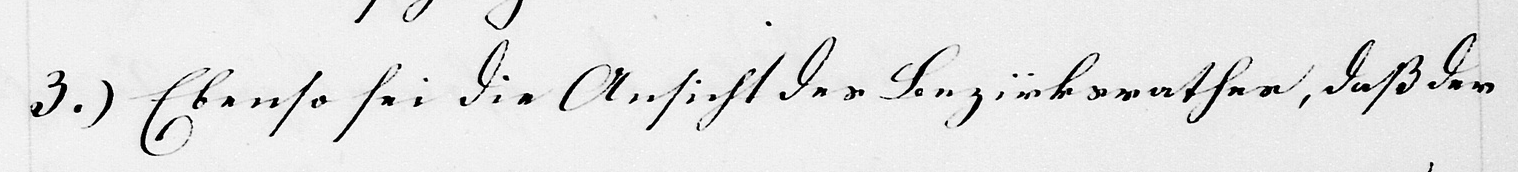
3.) Ebenso sei die Ansicht des Bezirksrathes, daß der
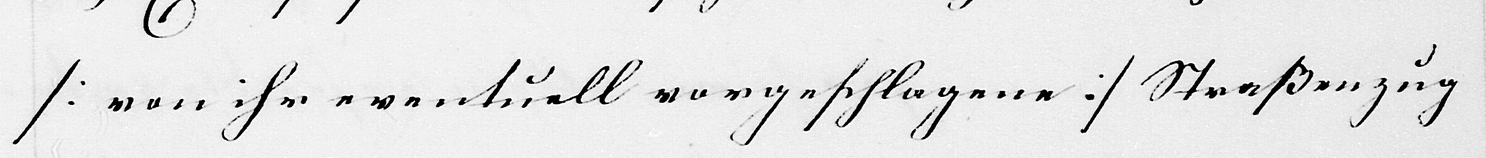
[von ihr eventuell vorgeschlagene] Straßenzug
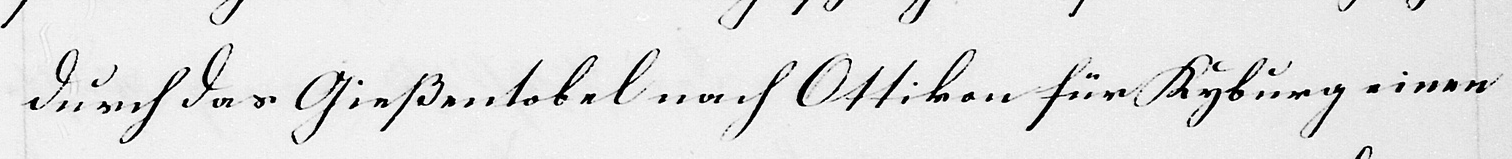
durch das Gießentobel nach Ottikon für Kyburg einen
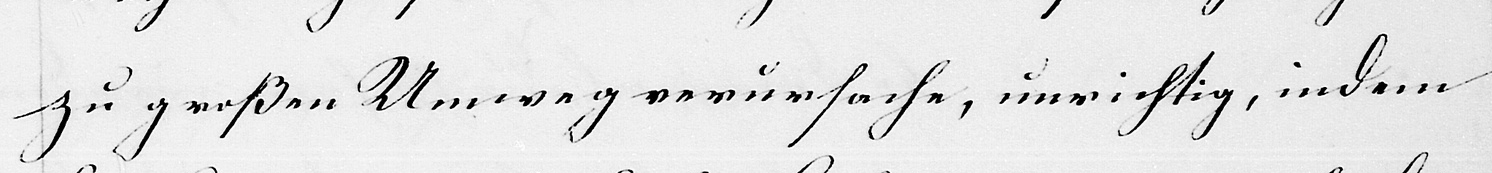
zu großen Umweg verursache, unrichtig, indem
